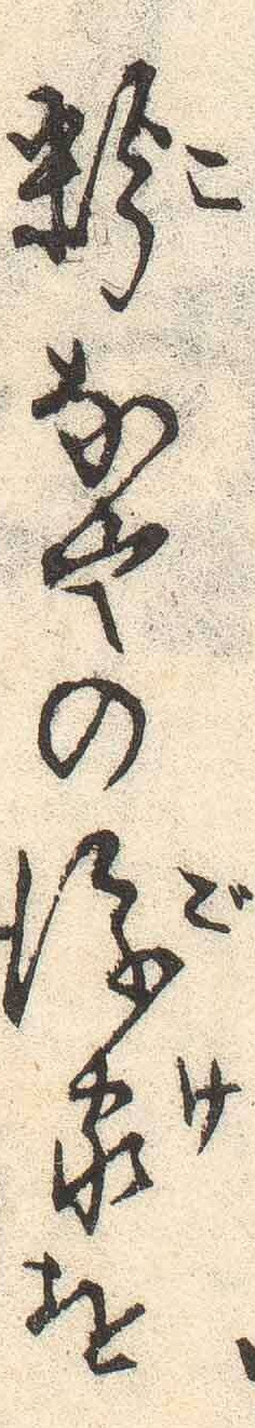粉なやの後家を
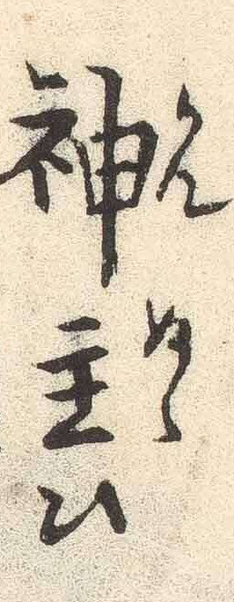神主は
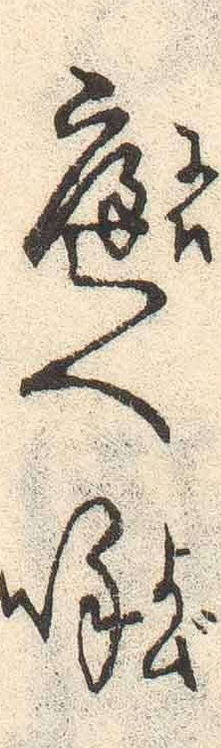庭へ呼
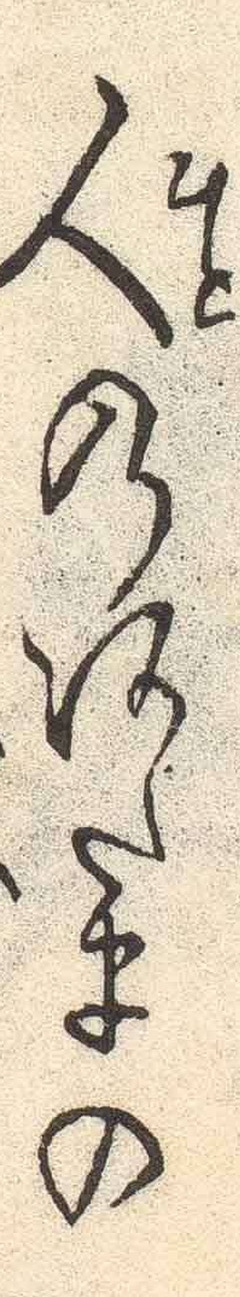人のあたまの
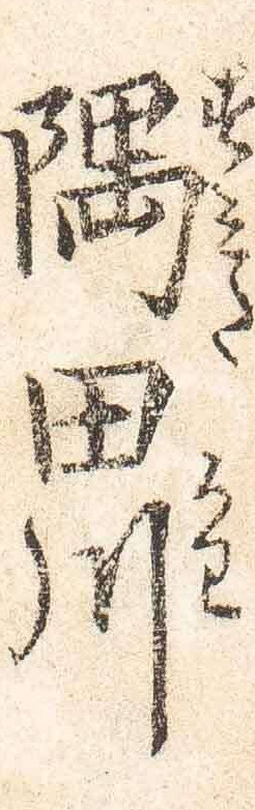隅田川
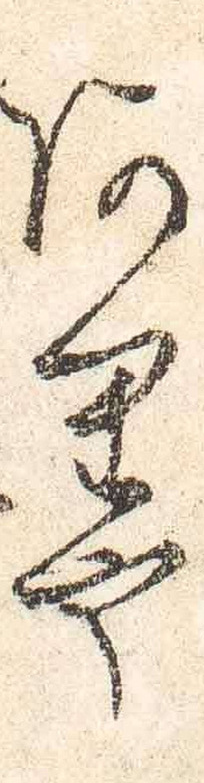ありや
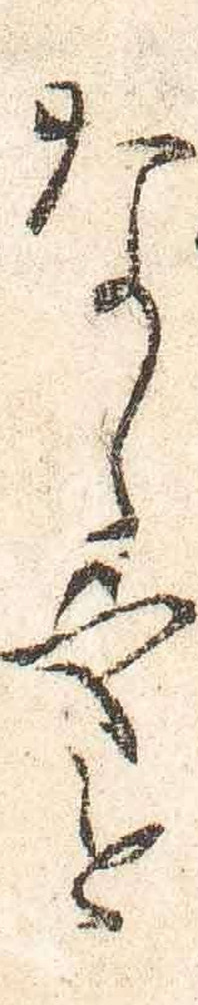なしやと
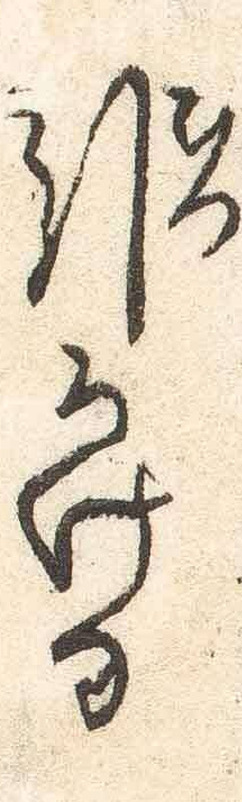引かける
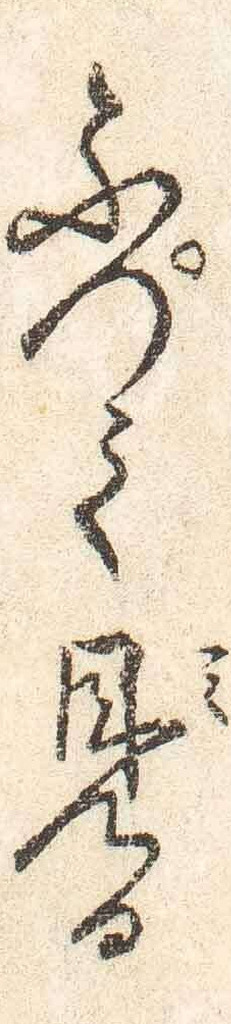ふつて見る
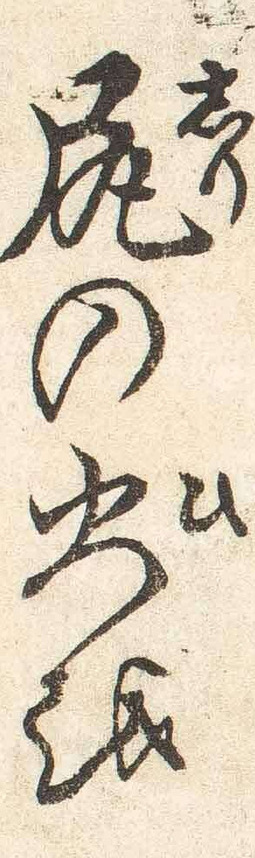尻の火を
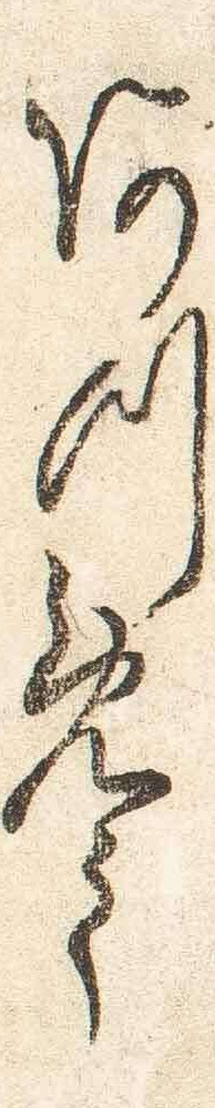あつめて
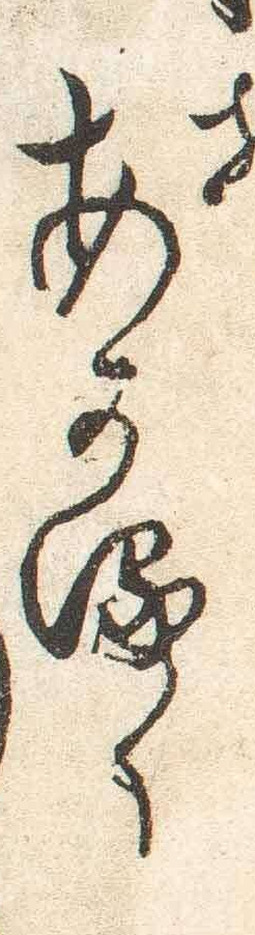あかるく

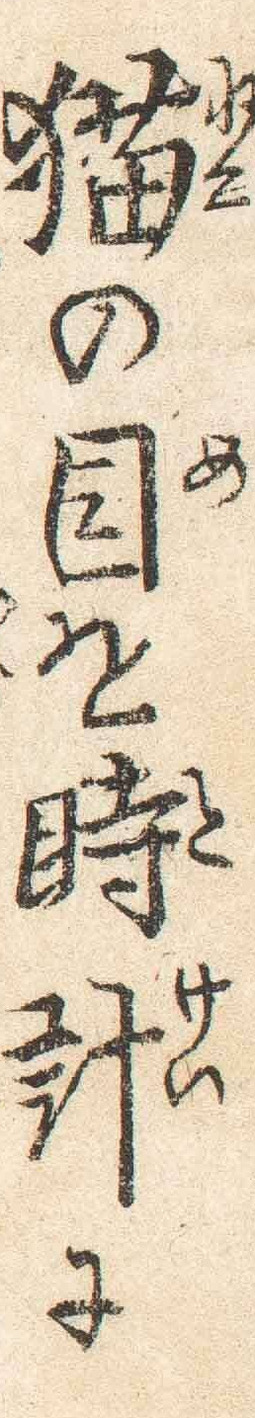猫の目を時計に
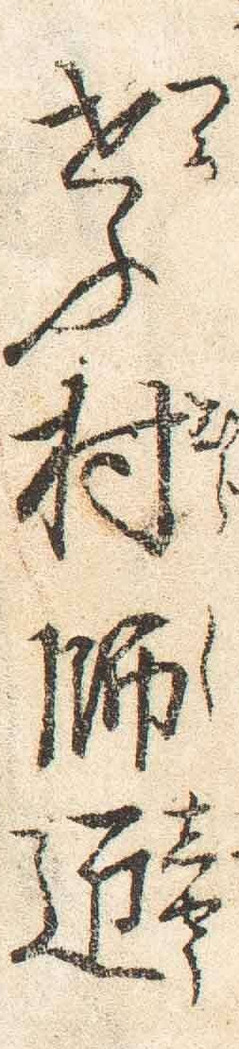遣ふ村師匠
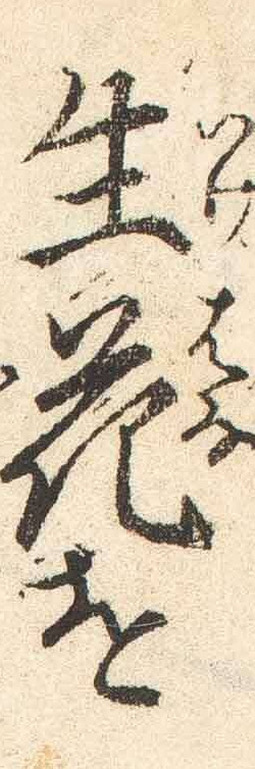生花を
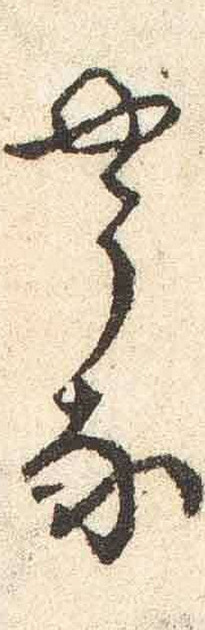やうな
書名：画本柳樽
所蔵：東京学芸大学附属図書館 国文学研究資料館
